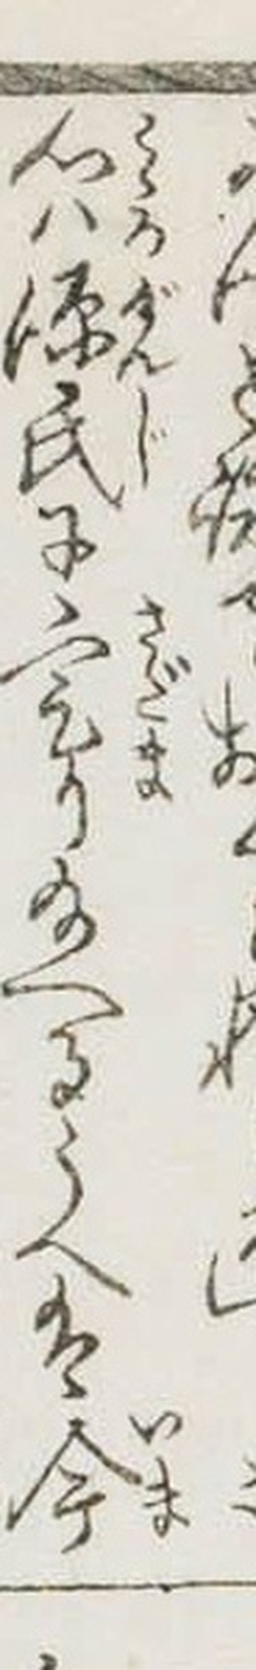心は源氏に定り給へるうへは今
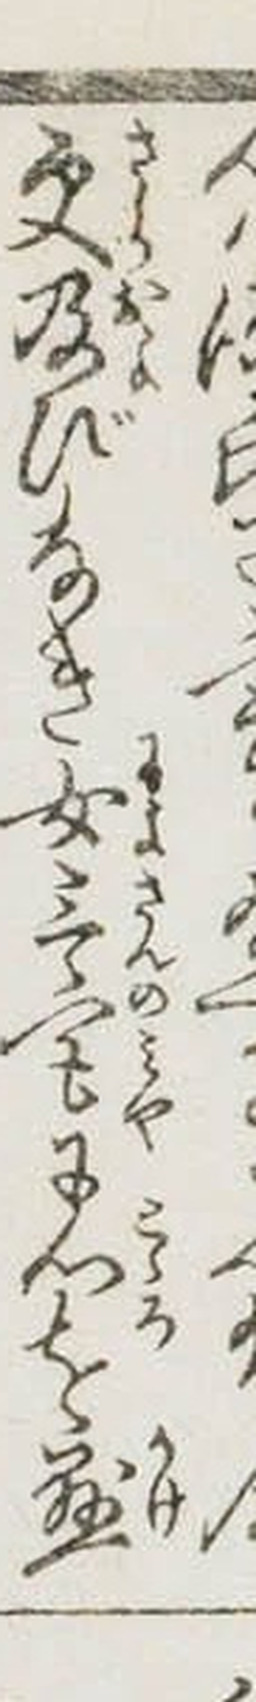更及びなき女三宮に心を懸
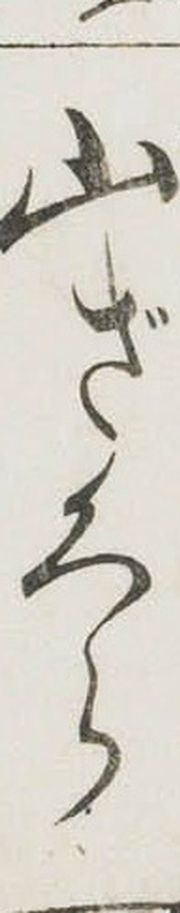山ざくら
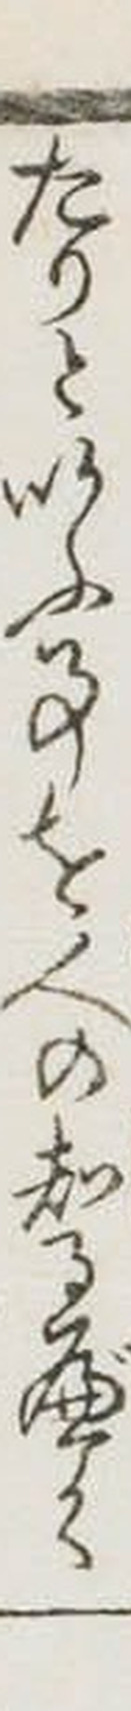たりといふ事を人の知るべく
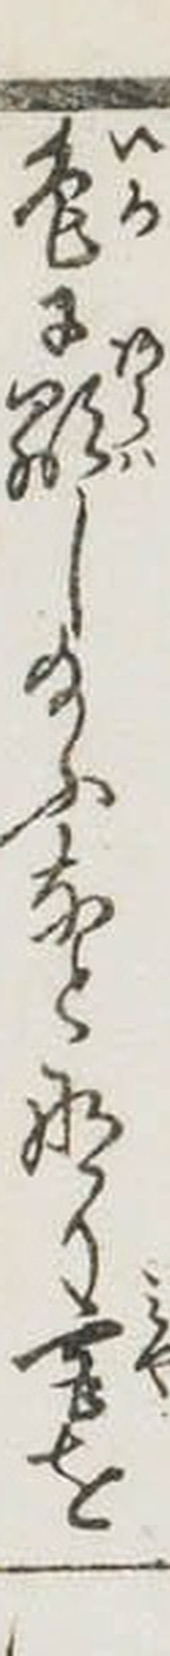色に顕し給ふなとなり宮を
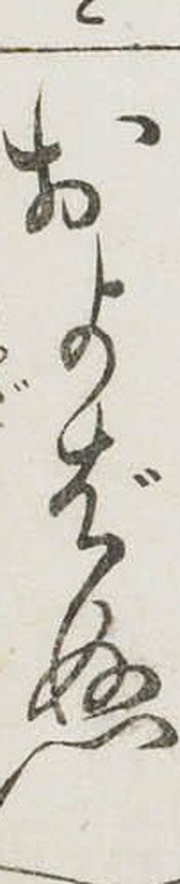およばぬ
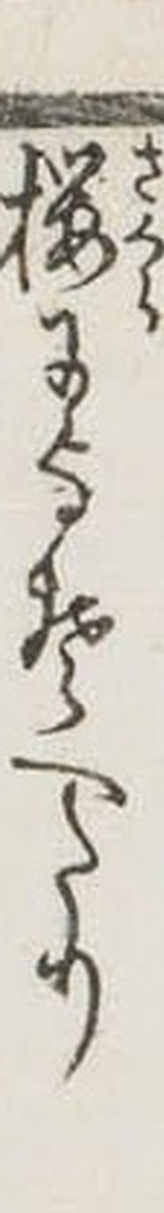桜によそへたり
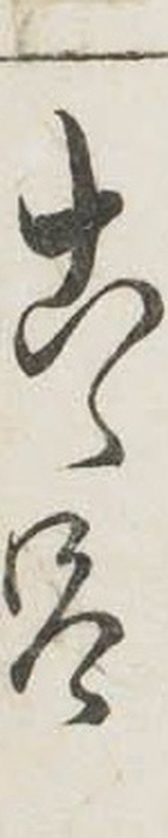こゝろ
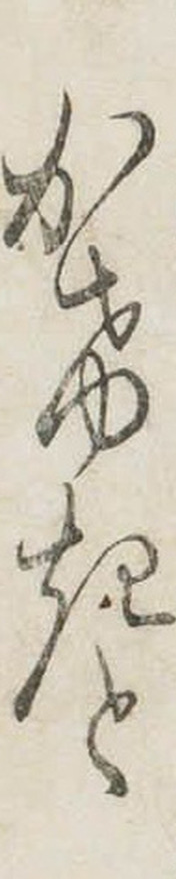かけきと

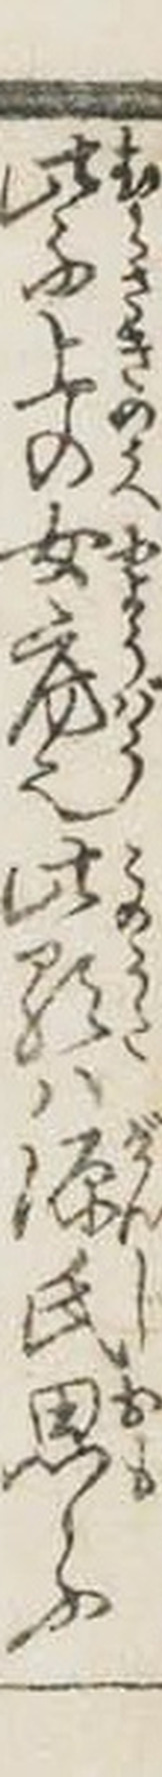紫上の女房也此歌は源氏思ふ
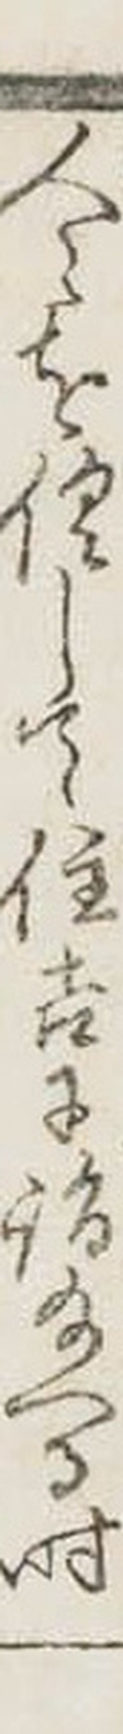人々を倶して住吉に詣給へる時
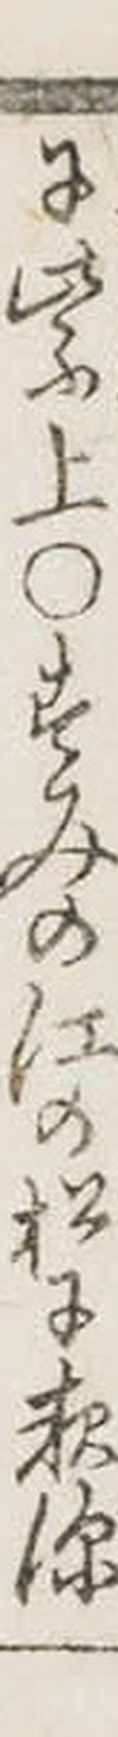に紫上○すみの江の松に夜深
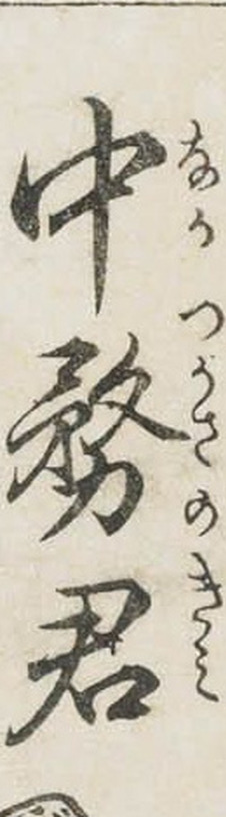中務君
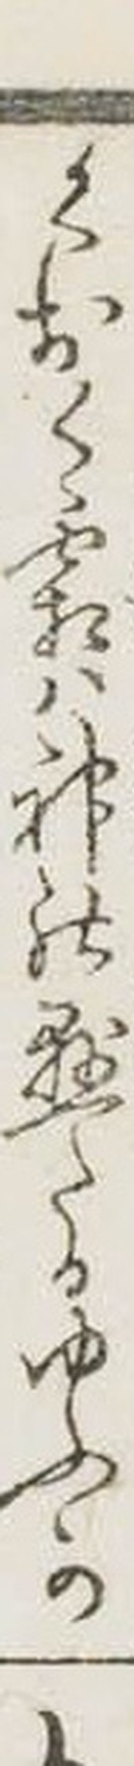くおく霜は神の懸たるゆふか
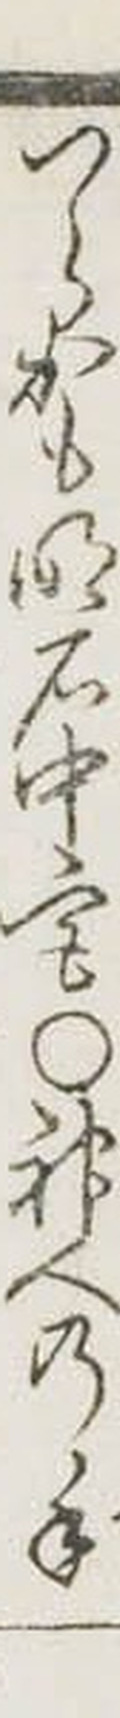づらかも明石中宮○神人の手
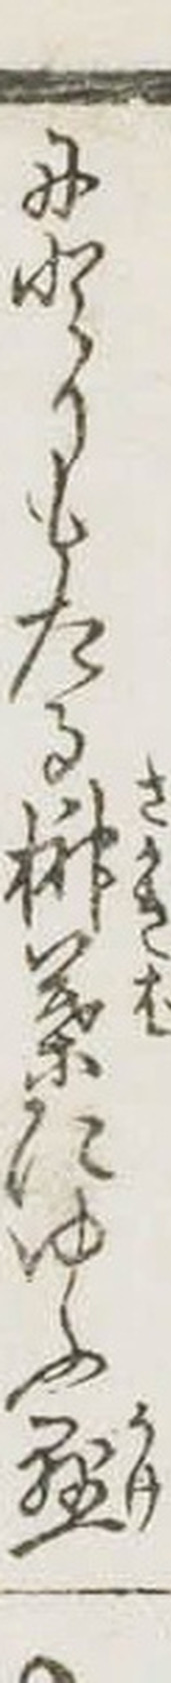にとりもたる榊葉にゆふ懸
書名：源氏百人一首
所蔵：東京学芸大学教育コンテンツアーカイブ
